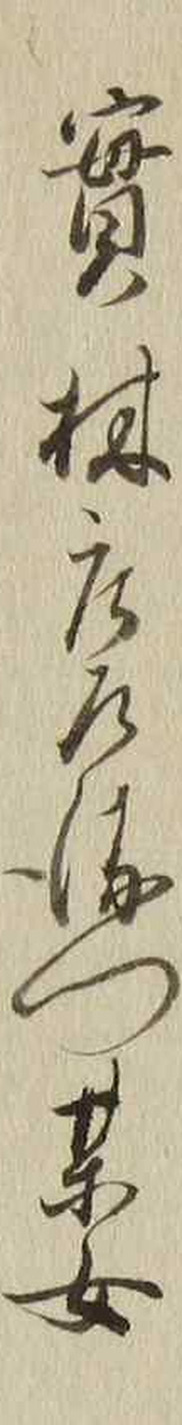実林庄左衛門某女
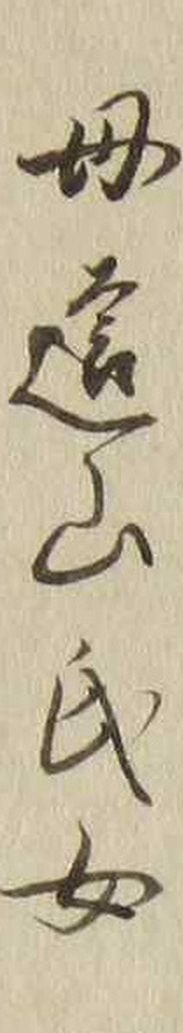母遠山氏女

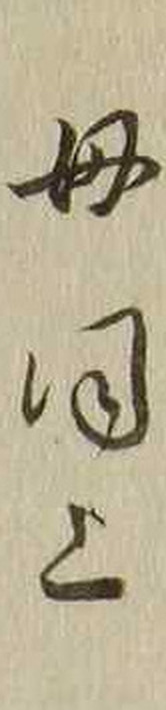母同上
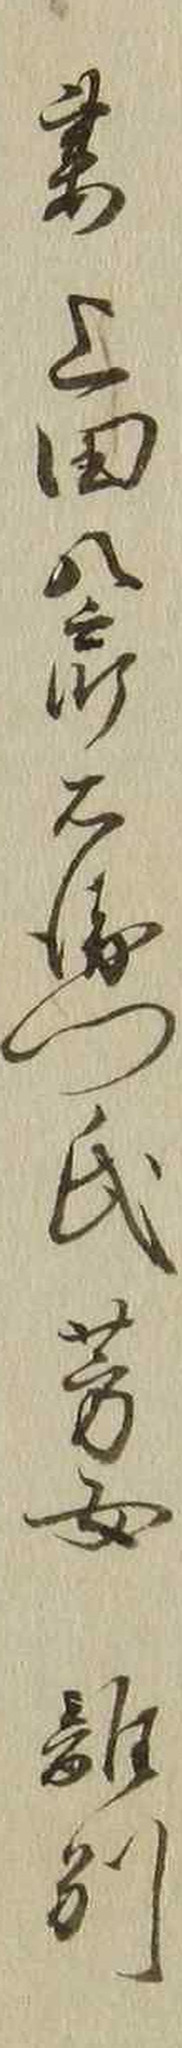妻上田八郎右衛門氏芳女離別
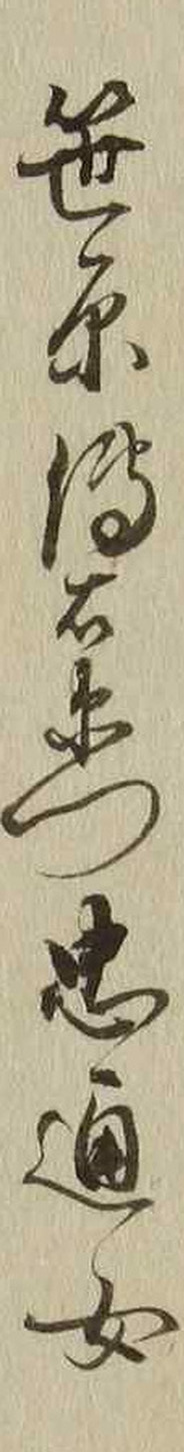笹原伝右衛門忠道女同
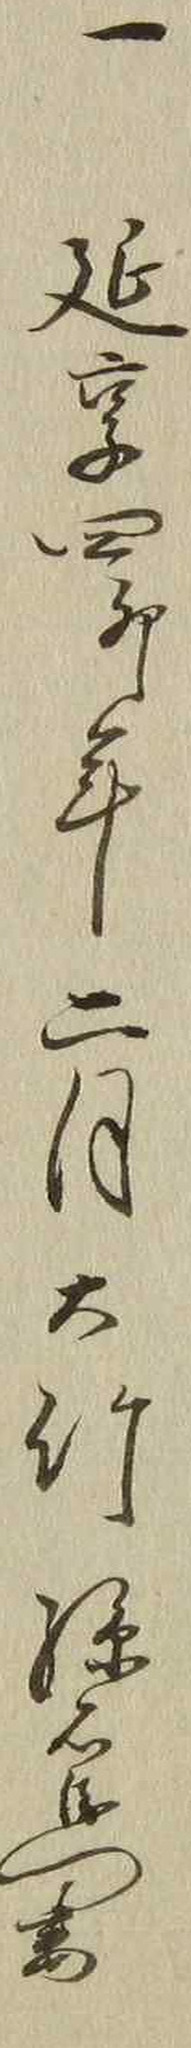一延享四卯年二月大竹孫右衛門妻
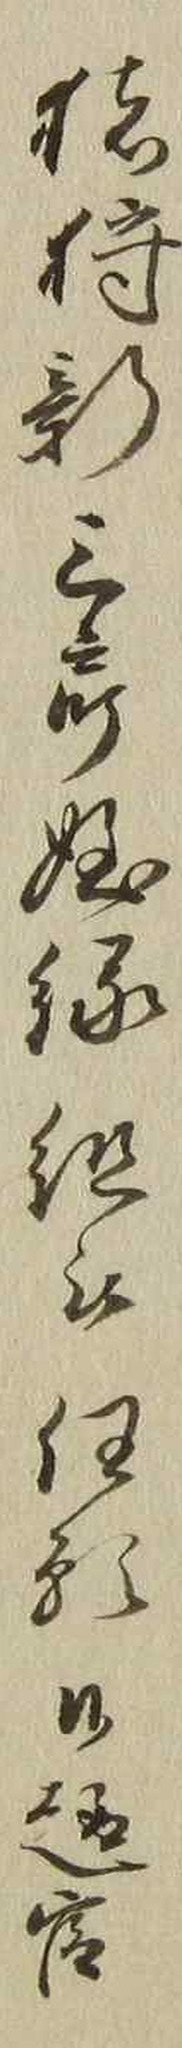猪狩新三郎姪縁組被任願候趣官
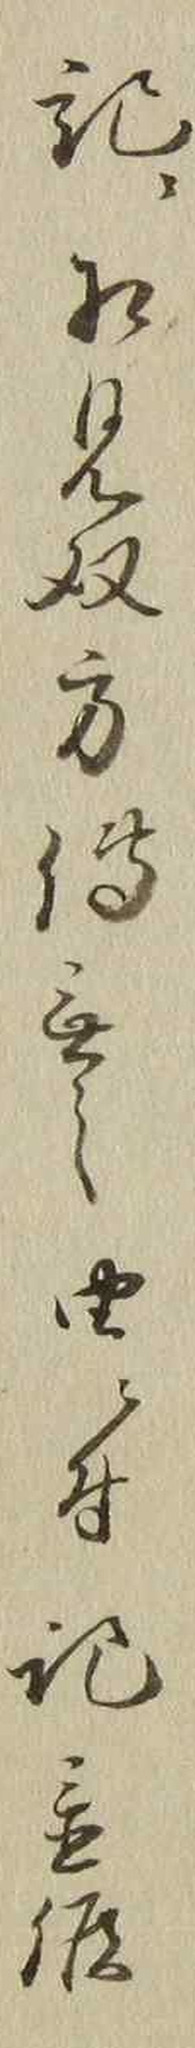記ニ相見双方伝無之由ニ付記置候
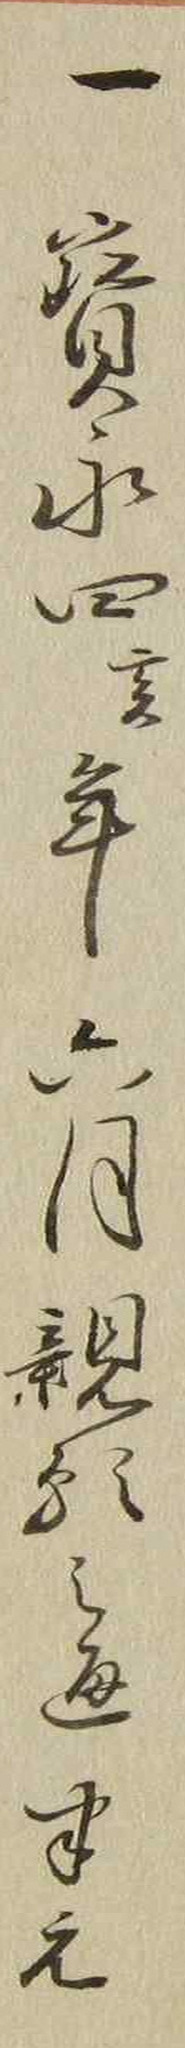一宝永四亥年六月親願之通半元
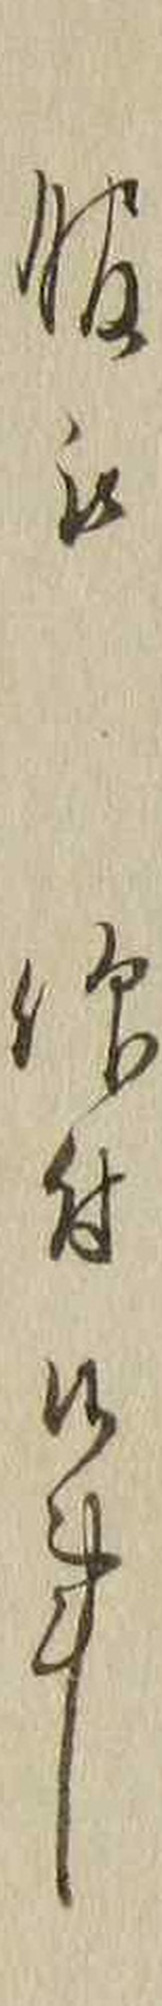服被仰付候事
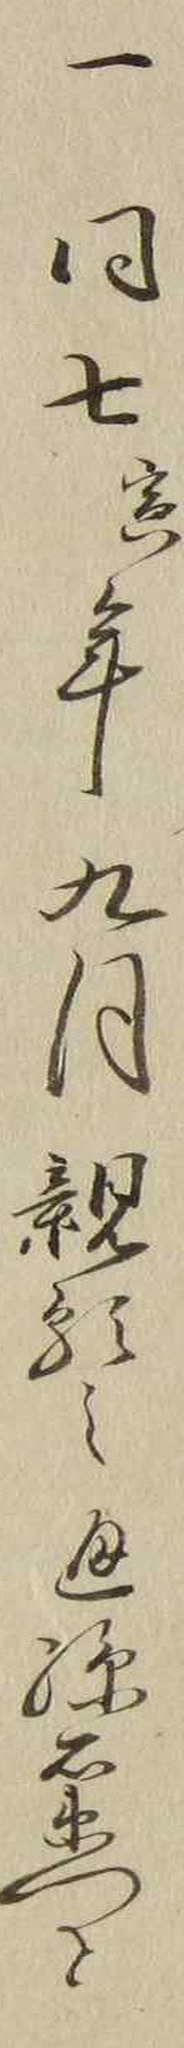一同七寅年九月親願之通孫右衛門と
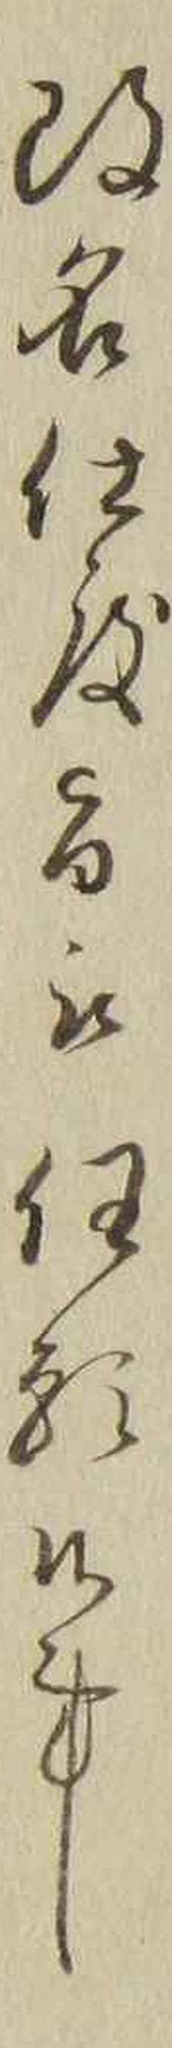改名仕度旨被任願候事

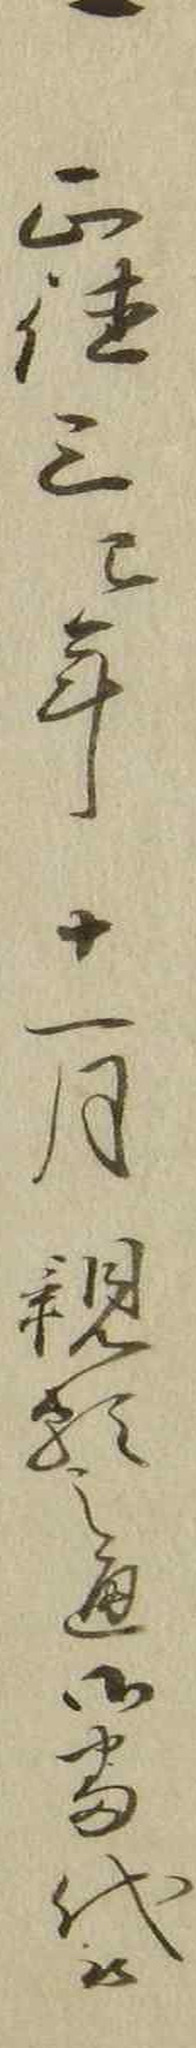一正徳三巳年十一月親願之通御番代被
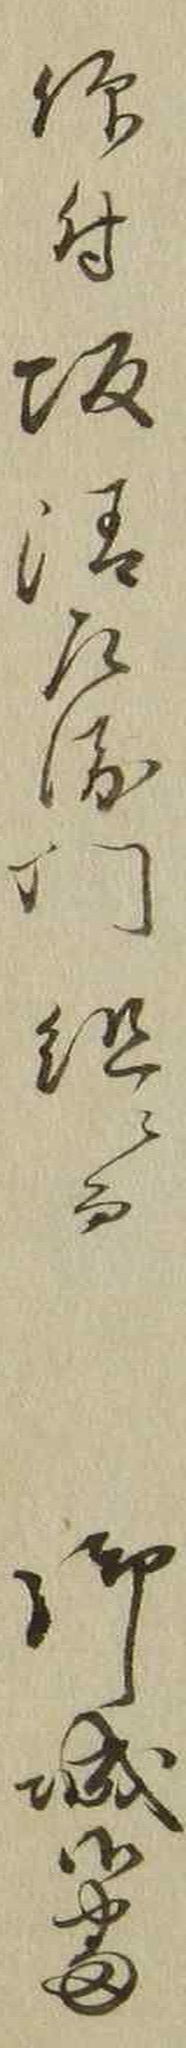仰付坂清左衛門組ニ而御城御番
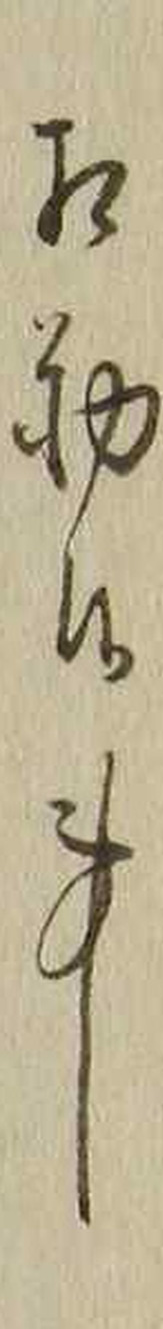相勤候事
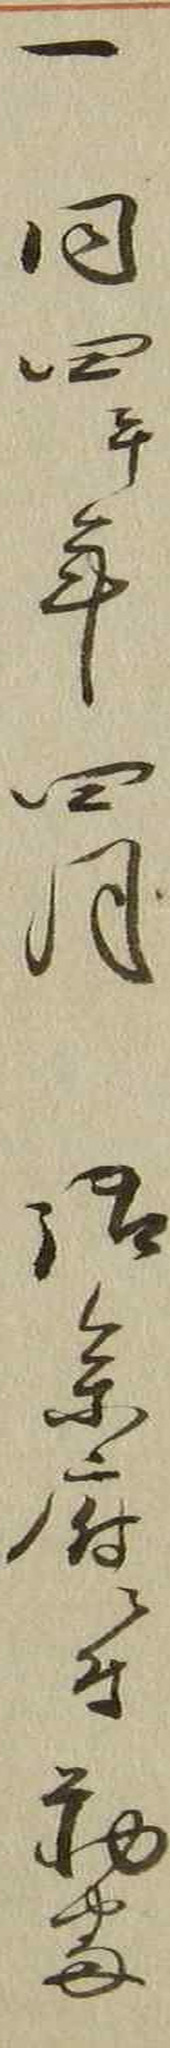一同四午年四月御参府ニ付勤番
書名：諸士系譜　巻之68　を之部2
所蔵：会津若松市立会津図書館
